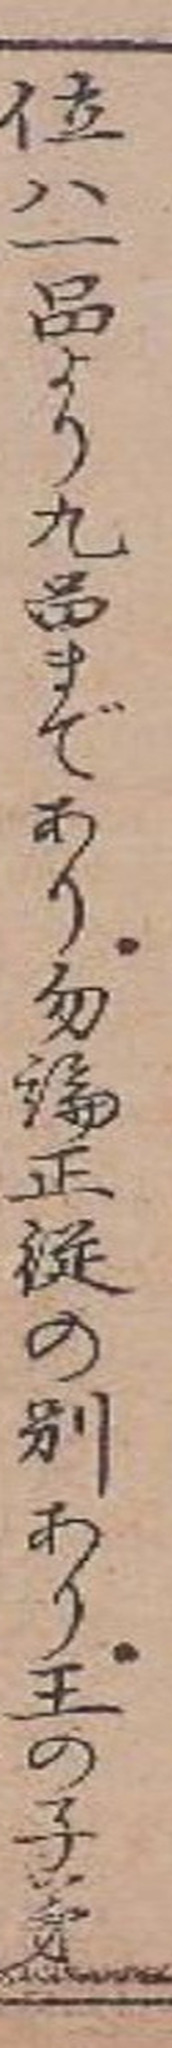位は一品より九品まであり、勿論正従の別あり、王の子弟
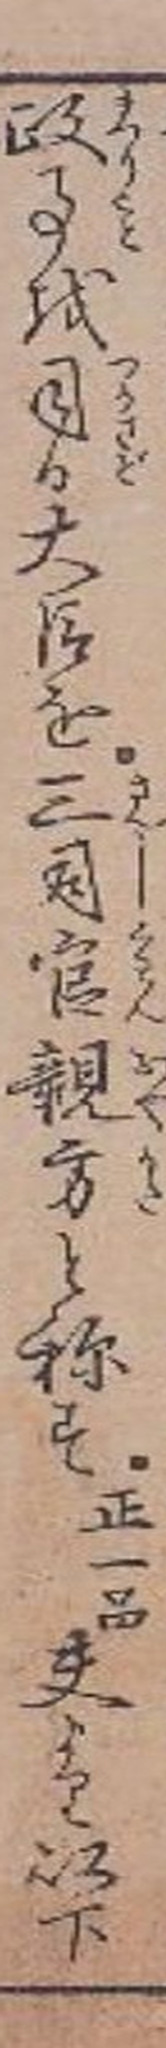政事を司る大臣を、三司官親方と称す、正一品夫より以下
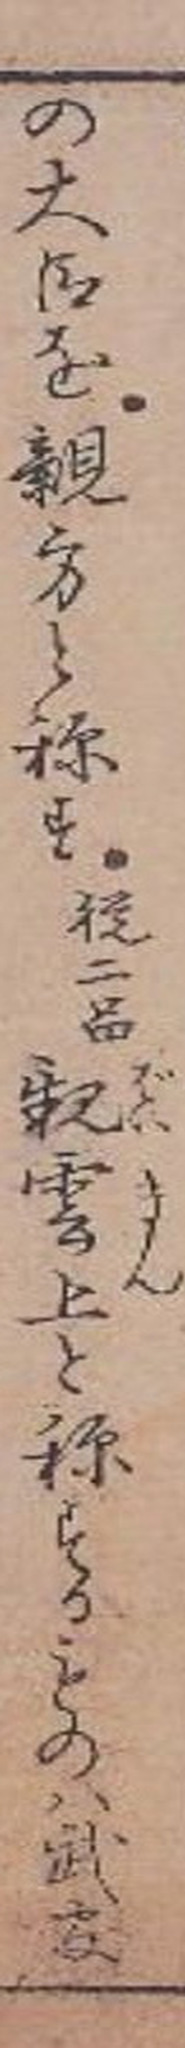の大臣を、親方と称す、従二品親雲上と称するものは武官
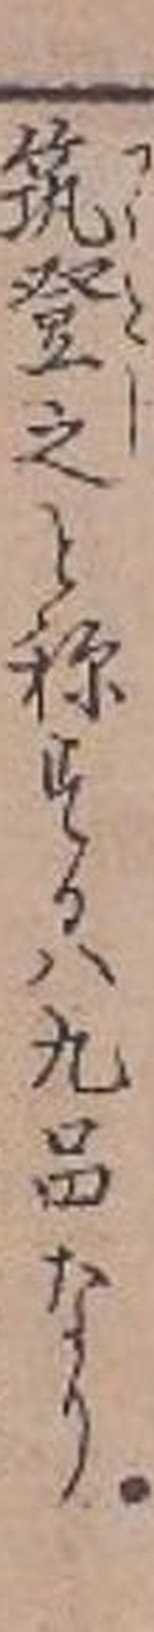筑登之と称するは九品なり、
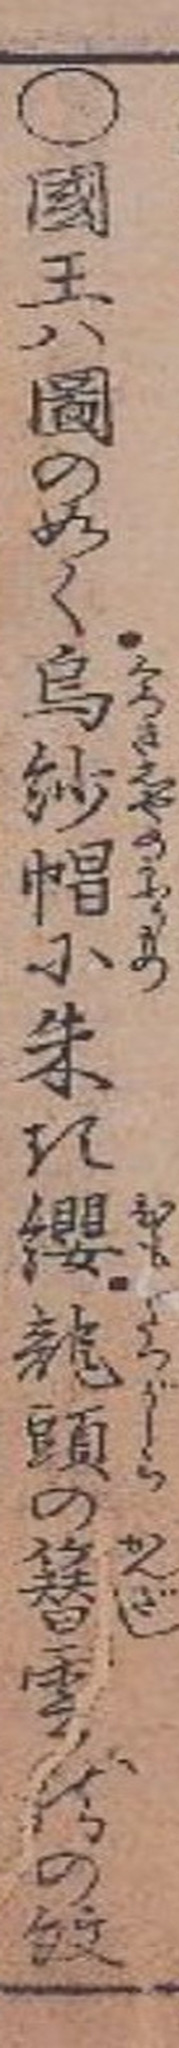○国王は図の如く、烏紗帽に朱き纓、龍頭の簪雲龍の紋

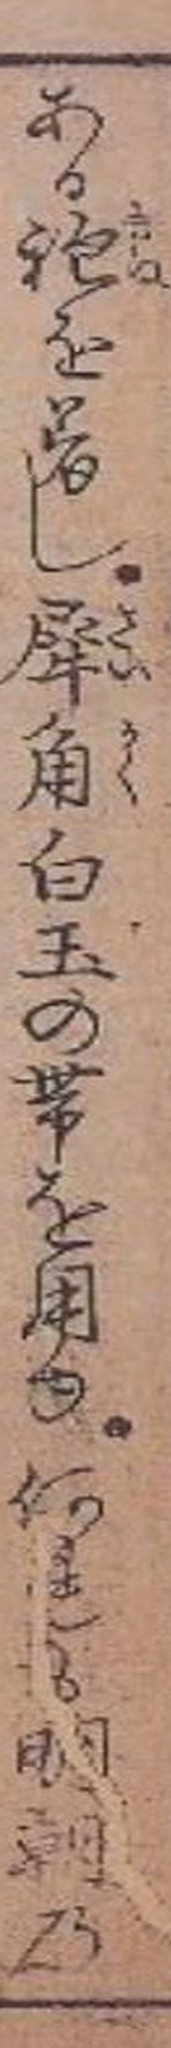ある袍を着し、犀角白玉の帯を用ゆ、何れも明朝の
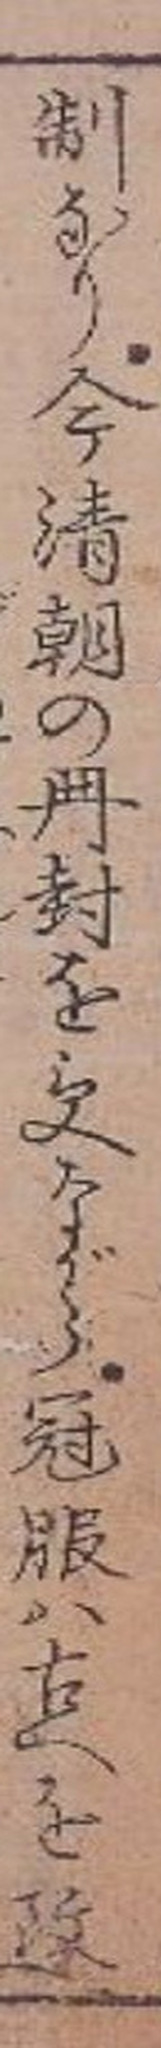制なり、今清朝の冊封を受ながら、冠服は古へを改
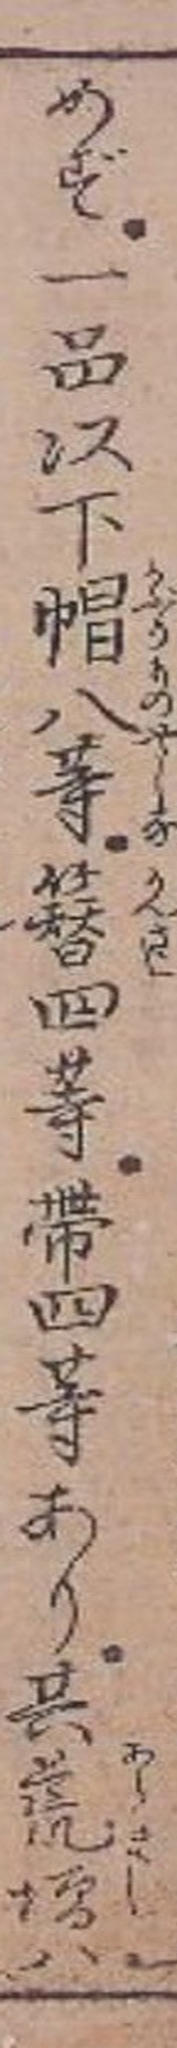めず、一品以下帽八等、簪四等、帯四等あり、其荒増は、
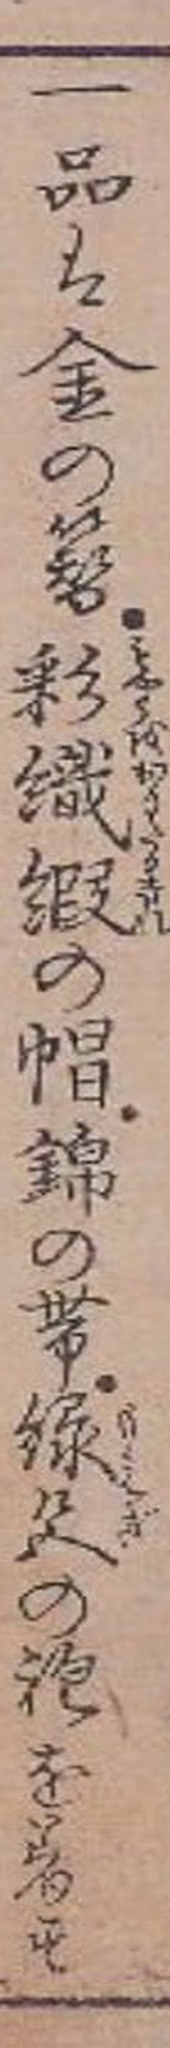一品は金の簪、彩織緞の帽、錦の帯、緑色の袍を着す
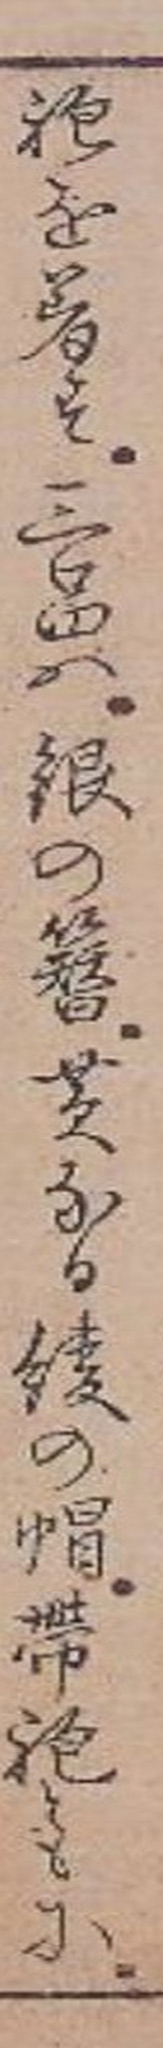袍を着す、三品は、銀の簪、黄なる綾の帽、帯袍ともに、
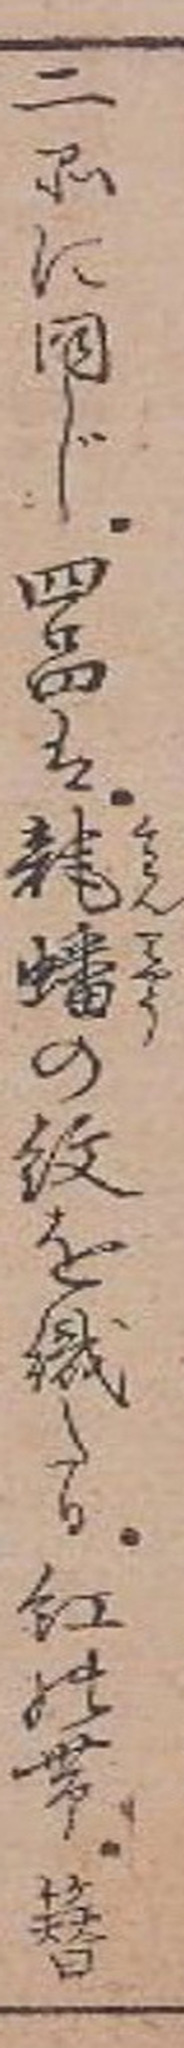二品に同じ、四品は龍蟠の紋を織たる、紅の帯、簪
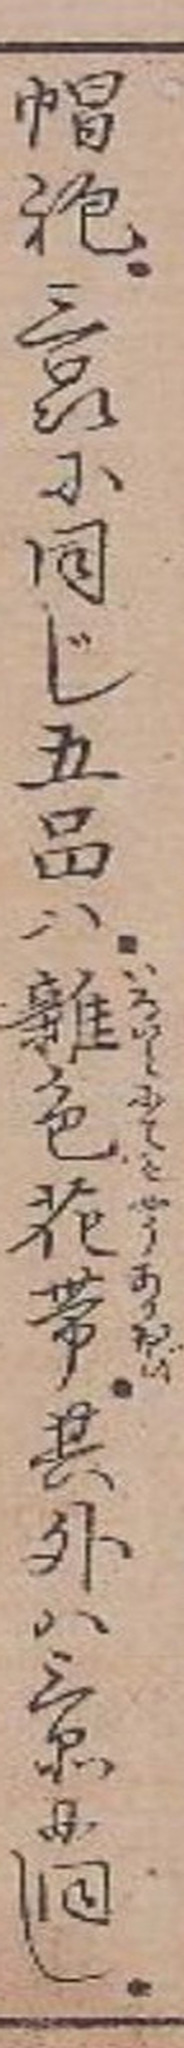帽袍、三品に同じ五品は、雑色花帯、其外は三品に同し、
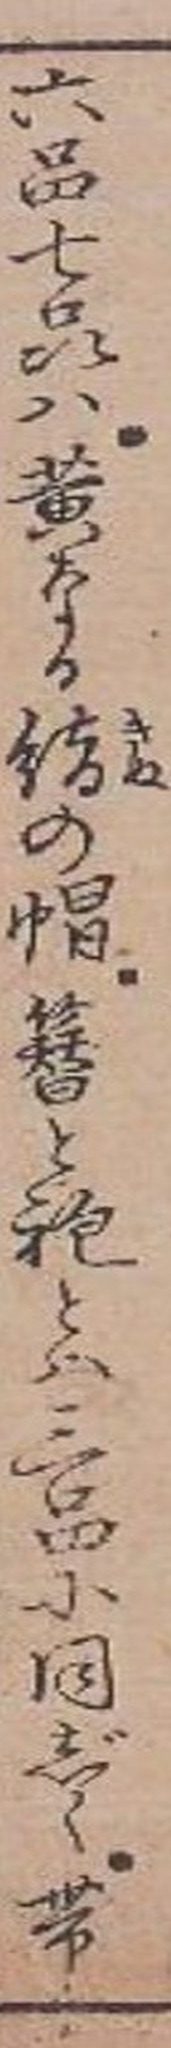六品七品は、黄なる絹の帽、簪と袍とは三品に同じく、帯
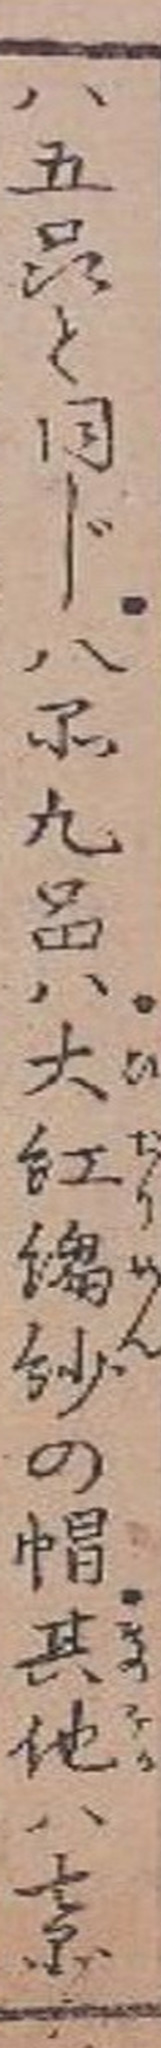は五品と同じ、八品九品は、火紅縮紗の帽、其他は七品
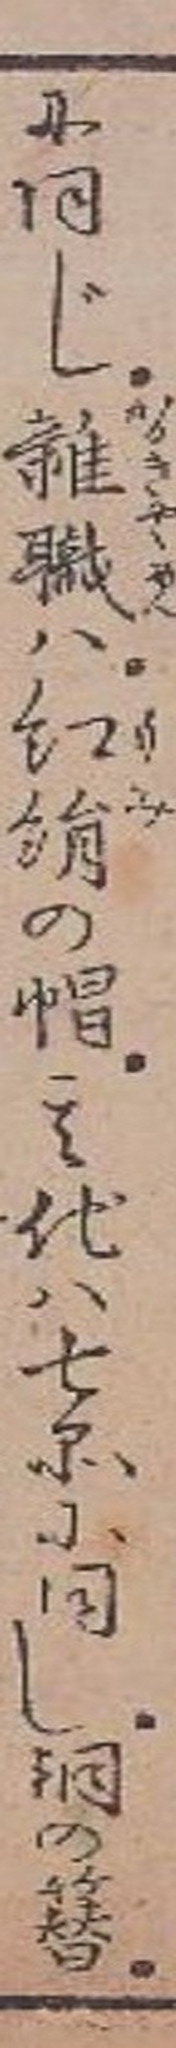に同じ、雑職は、紅絹の帽、其他は七品に同し、銅の簪、
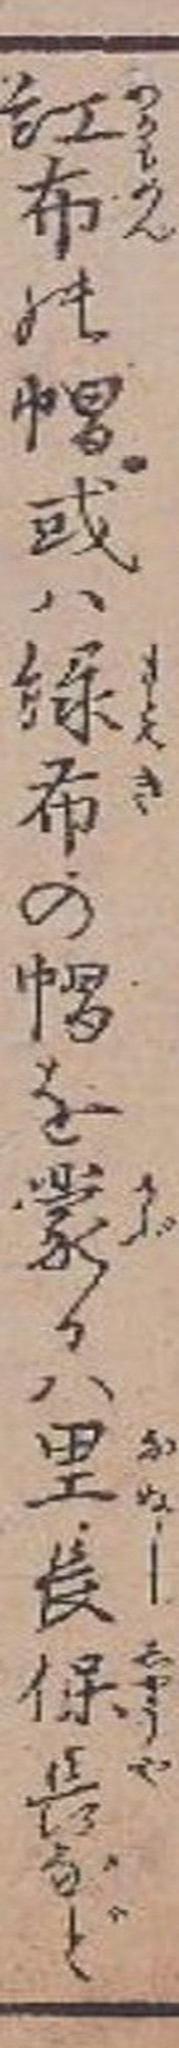紅布の帽、或は緑布の帽を蒙るは里長保長など
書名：琉球談
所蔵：University of the Ryukyus Library
